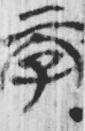○（娩）
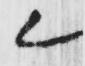乙
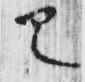巳
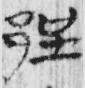郢
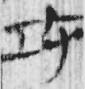攻
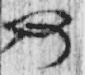尹
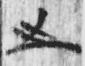之
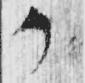人
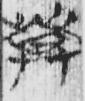登
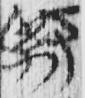○（賢）
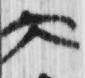大
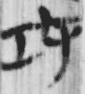攻
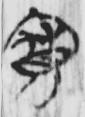○（府）
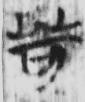苛
